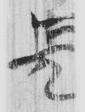長
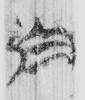於
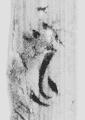水
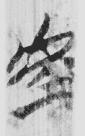𫊟
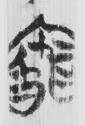{尒䎽}
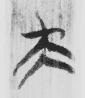夫
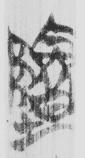險
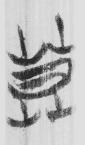莫
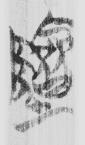險
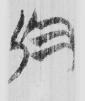於
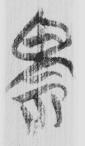{鬼示}
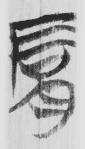{厂肙}
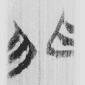非
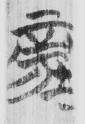坪
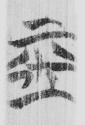亞
